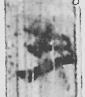之
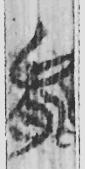能
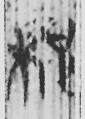枳
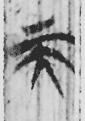天
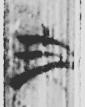之
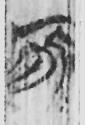所
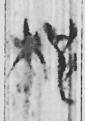枳
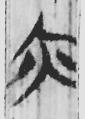亦
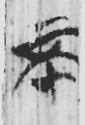不
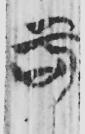可
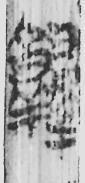{亯羊帚止}
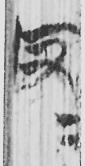反=
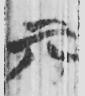亓
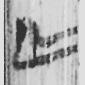亡
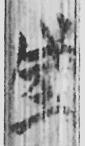成
